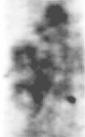鞅
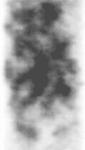○（豻）
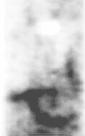○（鞍）
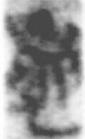○（豻）
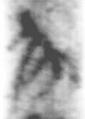尾
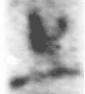之
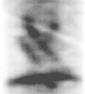之
